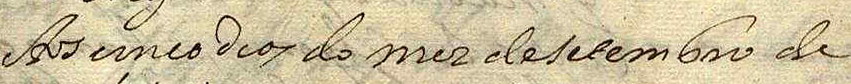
Aos cinco dias do mez de setembro de
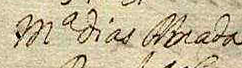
ma dias Amada
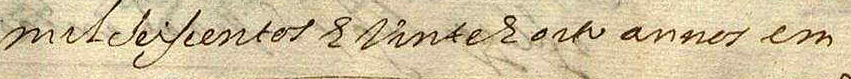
mil seiscentos E Vinte E oito annos em
